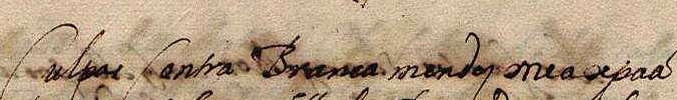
Culpas Contra Branca mendez mea xpaā
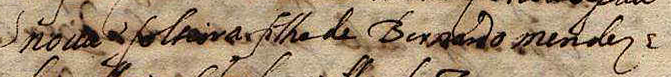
noua solteira filha de Bernardo mendez
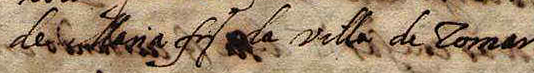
de Maria frz̄ da villa de Tomar
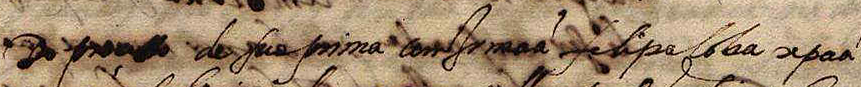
Do processo de sua prima com Jrmaā felipa Loba xpaā
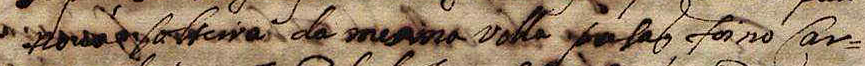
noua solteira da mesma villa presa q̄ foi no Car
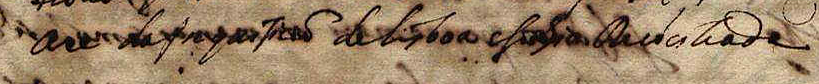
cere da Jnquisiçaõ de lisboa e sahio Recōciliada
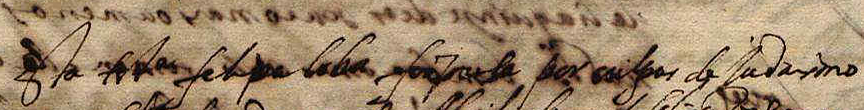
esta testa felipa loba foi presa, por culpas de Judaismo
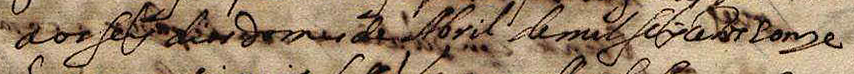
aos seis dias do mes de Abril de mil seiscētos E onze
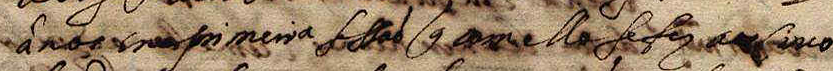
an̄os e na primeira sessaõ q̄ com elle se fez aos Sinco
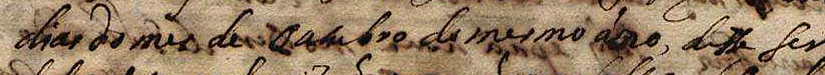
dias do mes de Outubro do mesmo an̄o, disse ser
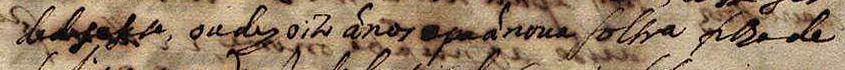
de desasete, ou dezoito an̄os xpaā noua soltra filha de
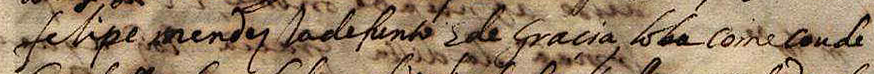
felipe mendez Ja defunto E de Gracia, loba começou de
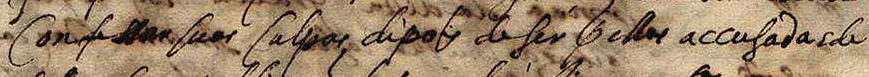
Confessar suas Culpas dipois de ser ꝑ ellas accusada E de
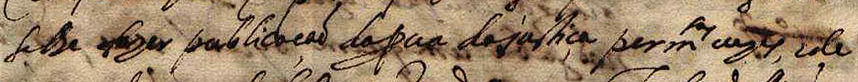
se lhe fazer publicaçaõ da ꝓua da justiça per mtas uezes, e de
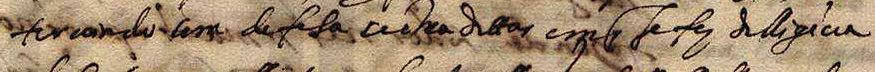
ter uimdo com defesa e cōtradittas em q̄ se fez dilligēcia
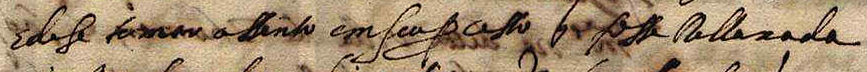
E dise tomar assento em seu ꝓcesso q̄ fosse Rellaxada
